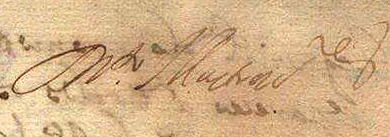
M.to Illustres Sres
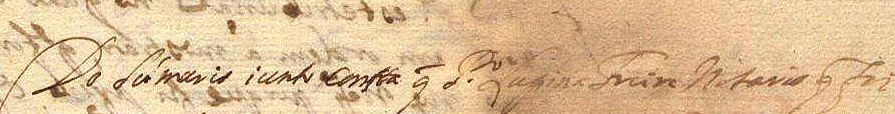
Do Sumario iunto consta q̄ P.o Lupina Freire Notario q̄ foi
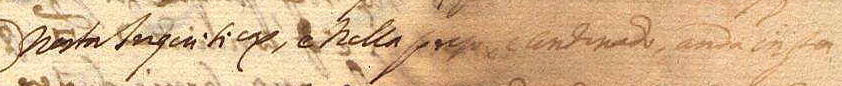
nesta Inquisiçaꝭ, e nella preso e condenado, anda infa
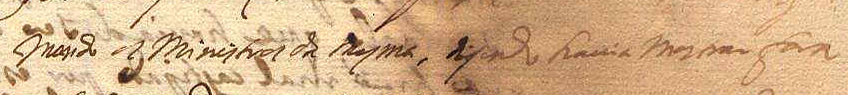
mando os ministros da mesma, disendo hauia mostrar fora
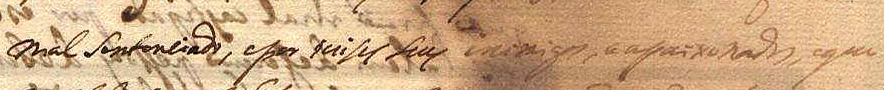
mal sentenciado, e por iuises seus inemigos, a apaixonados, e que
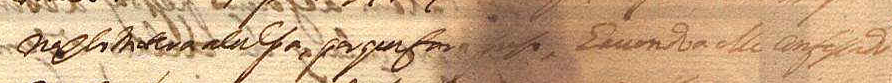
naꝭ cometera a culpa, por que fora preso, hauendo a elle confessado
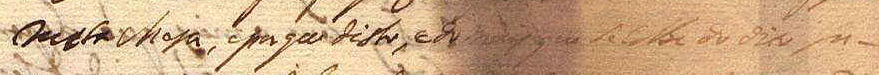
nesta Mesa, e porque disto, e do mais que se colhe do dito su
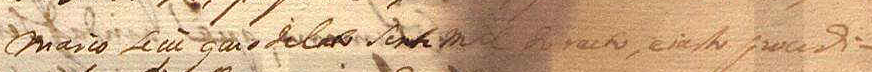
mario se ue que o delato sente mal do recto, e iusto procedi
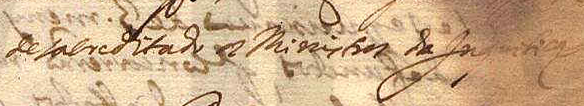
desacreditado os ministros da Jnquisiçaꝭ
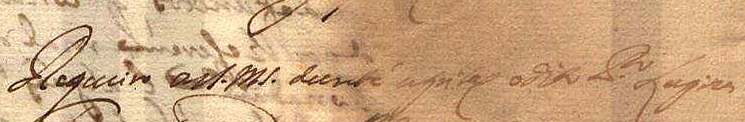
Requeiro a vs. ms. decretē a prisaꝭ o dito P.o Lupina
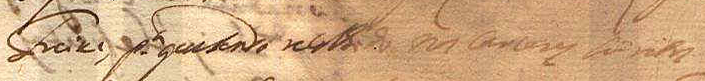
Freire, p.a que sendo recolhido nos carceres secretos
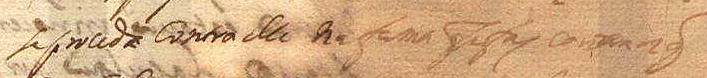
se proceda contra elle na fama q̄ se faz contra os q̄
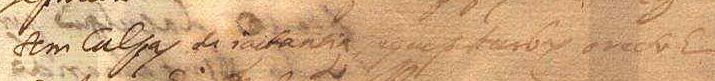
tem culpas da instansia, e que perturbaꝭ o recto E
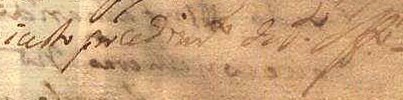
iusto prcedimto do sto off.o
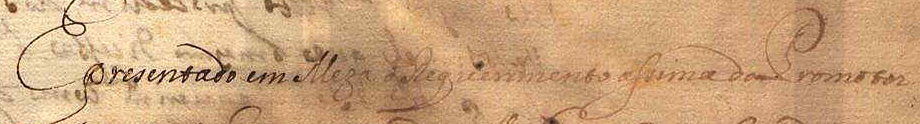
E presentado em Meza Requerimento assima do Promotor
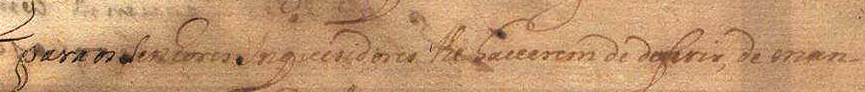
para os Senhores Inquisidores lhe hauerem de deferir, de man
